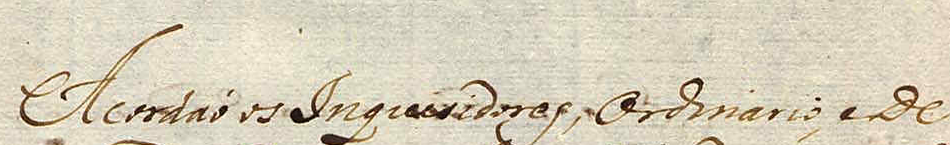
Acordaõ os Inquisidores, Ordinario, e De
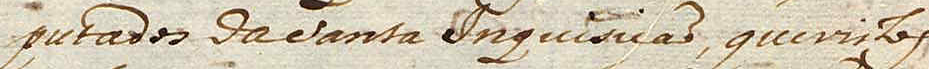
putados da santa Inquisiçaõ, que vistos
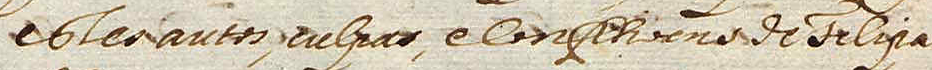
estes autos, culpas, e confissoens de Felipa
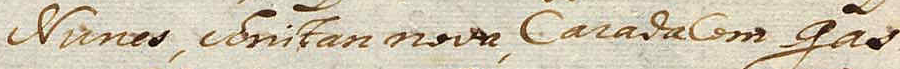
Nunes, christan nova, Cazada com Gas
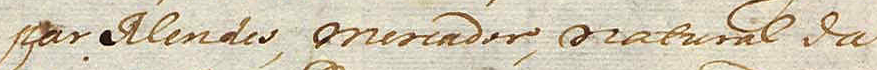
par Mendes, mercador, natural da
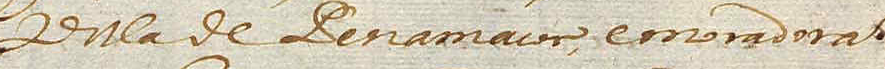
Villa de Penamacor, e moradora
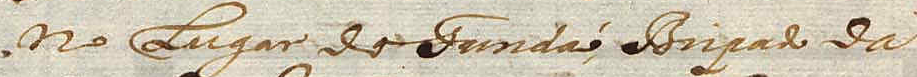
no Lugar do Fundaõ, Bispado da
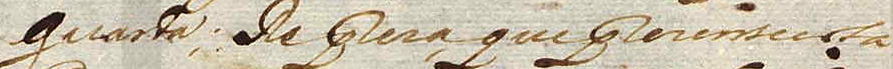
Guarda; Re preza, que prezente esta?
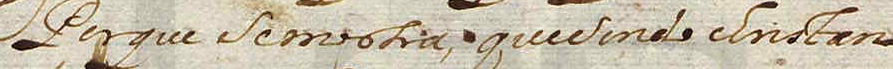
Porque se mostra, que sendo christan
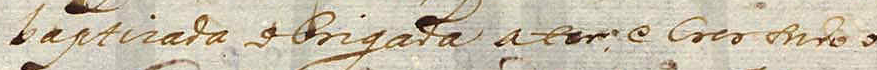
baptizada obrigada a ter, e crer tudo o
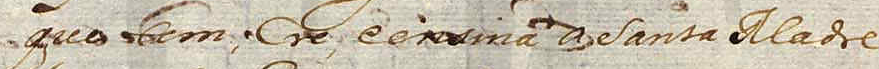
que tem; Cre, e ensina a santa Madre
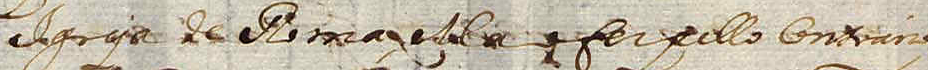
Igreja de Roma, ella o fez pello Contrario,
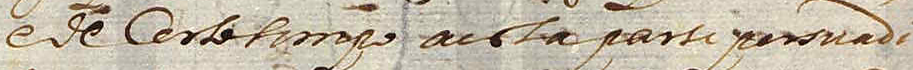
e de Certo tempo a esta parte persuadi
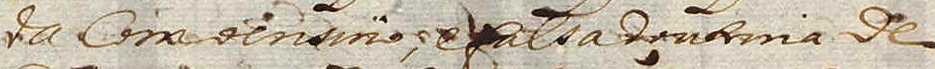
da Com o ensino, e falsa doutrina de
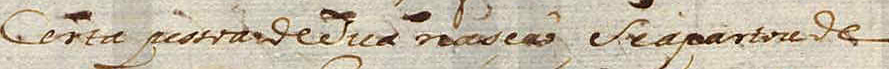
Certa pessoa de sua nascaõ, se apartou de
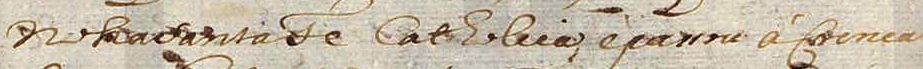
nossa santa Fe Catholica, e passou á Crenca
